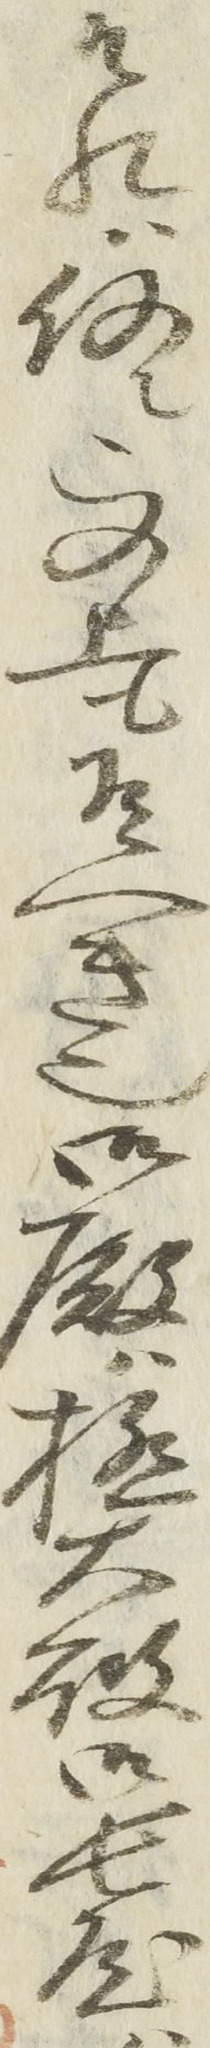ケれハ何レこの上も有へき也御殿ハ極大破長屋ハ之由
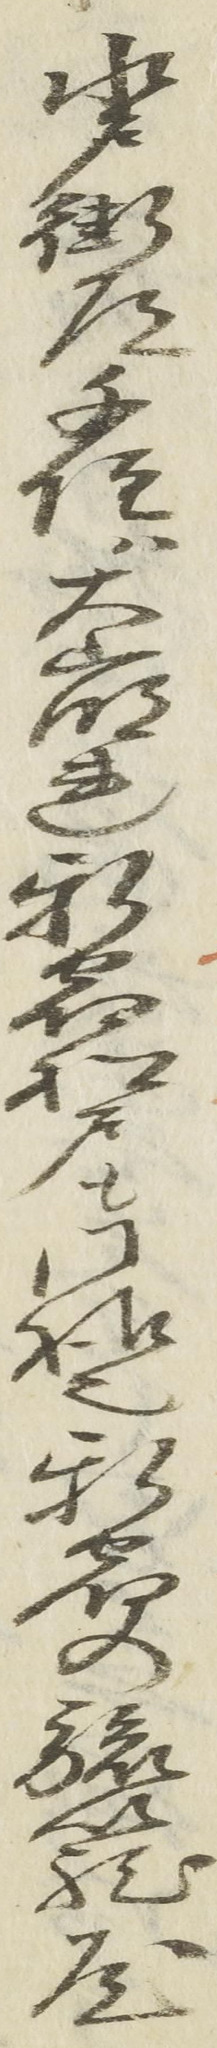一水戸街道千住ハ大崩れ新宿松戸も同様也新宿の旅籠屋
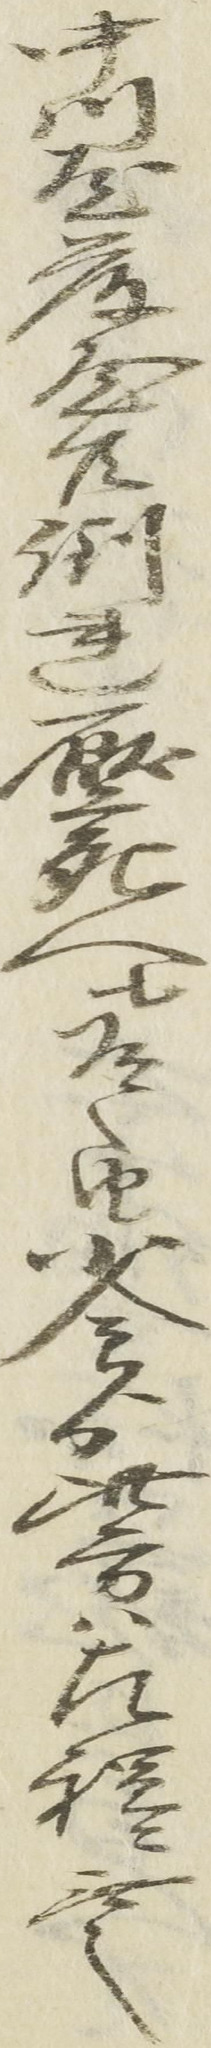中川屋藤屋共倒れ圧死人も有之由小倉ゟ此方ハ左程ニ無之
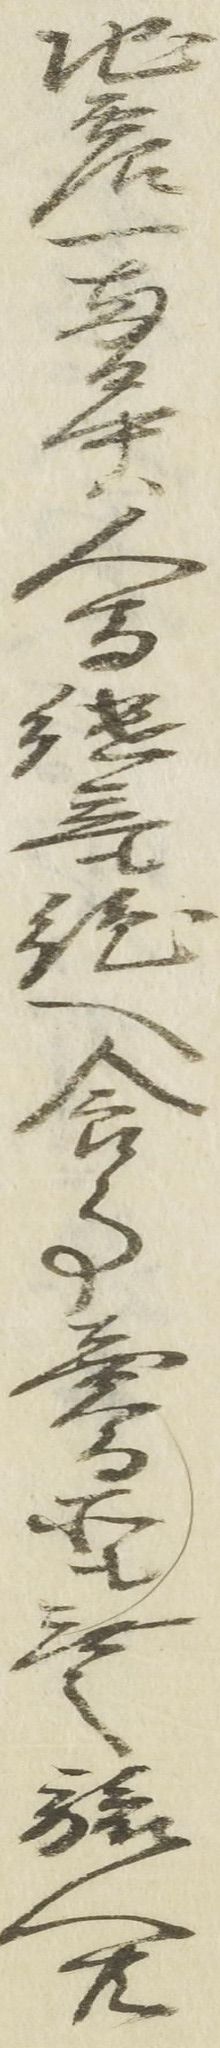地震一両日中ハ人馬継立も絶へ食事売る所も無之旅人共
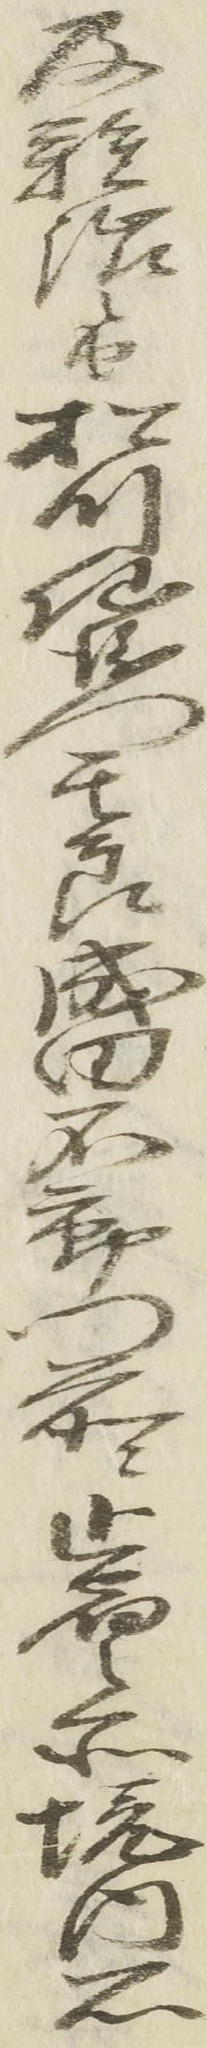及難渋候由松川仙衛門其節成田不動門前ニ止宿之所境内石
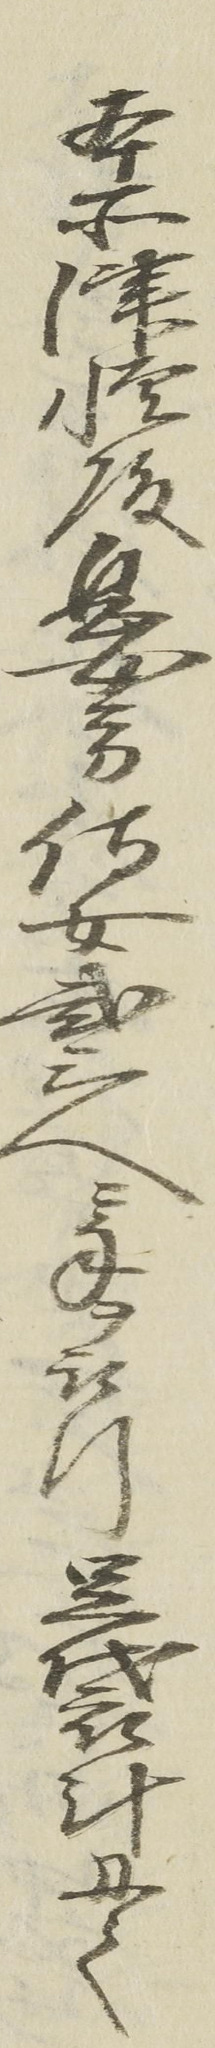一本所津軽殿息女方侍女弐参人ニ手ヲ被引足袋計にて
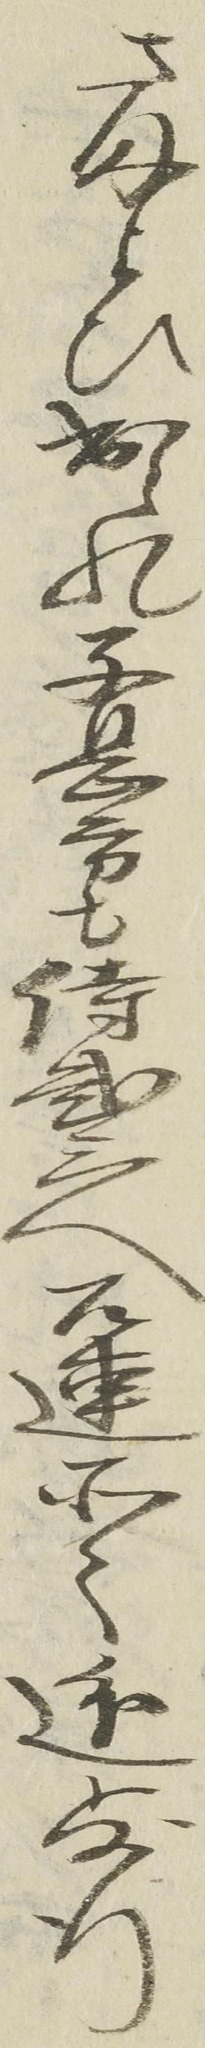さまよひ出られ子息方も侍弐三人召連所〻逃歩行
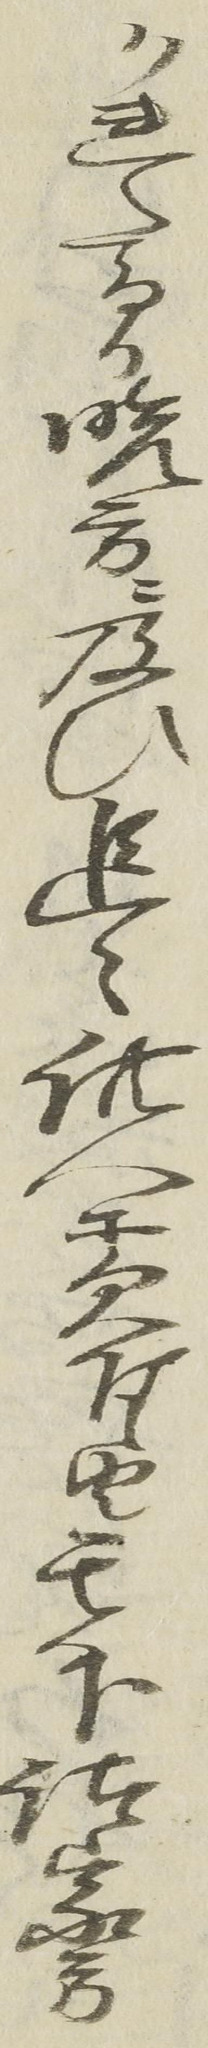ケれたるか晩方二及ひ追〻共人等欠付候由其外諸家方
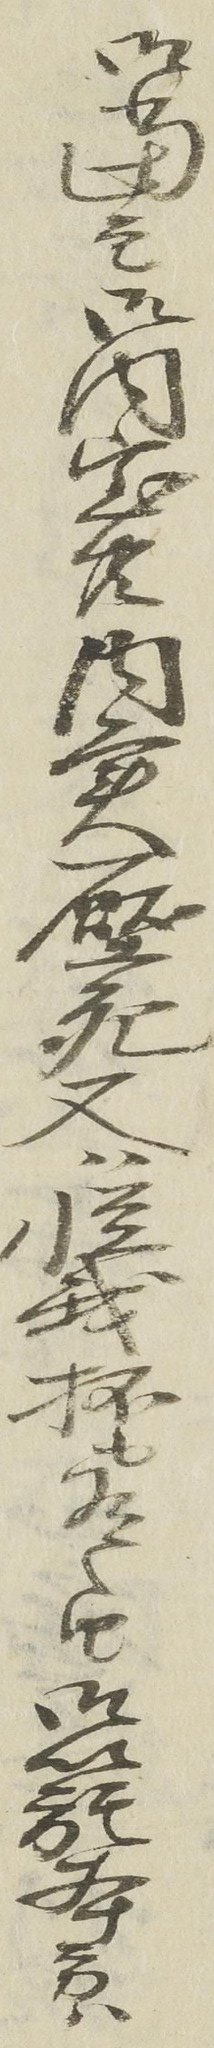御当主御内室共内実圧死又ハ怪我抔も有之由御籏本方ハ
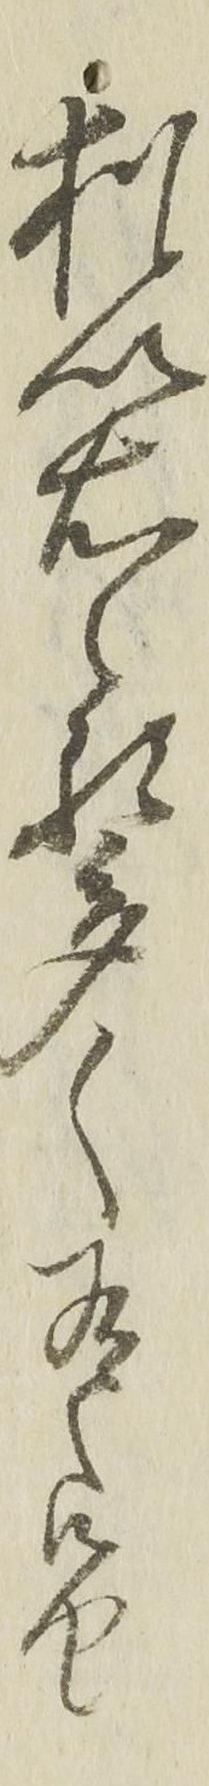猶以右之類多く有之候由
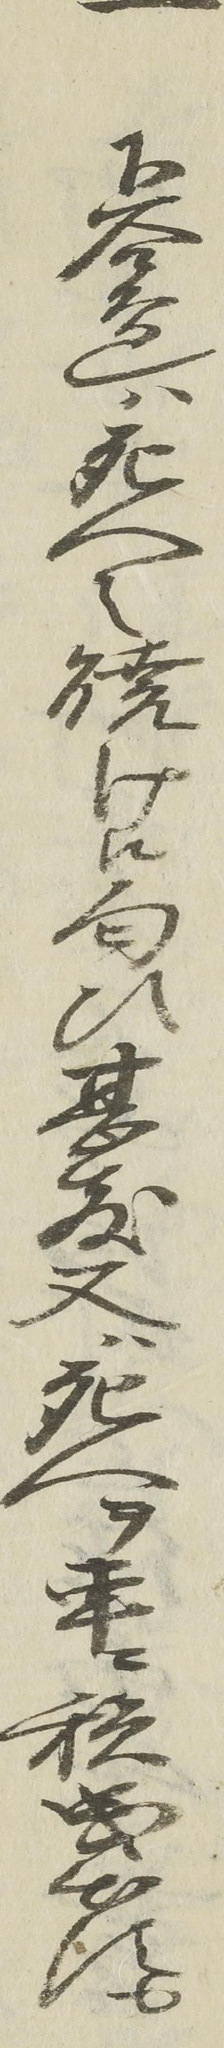一下谷辺ハ死人之焼け候匂ひ甚敷又ハ死人ヲ車ニ積曳出すも
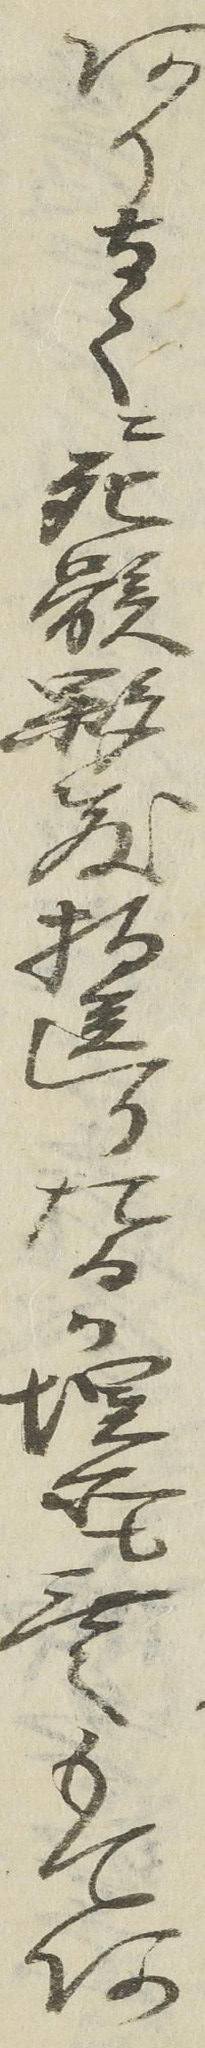あり寺〻二死骸夥敷持送りたるか埋所も無之もてあ
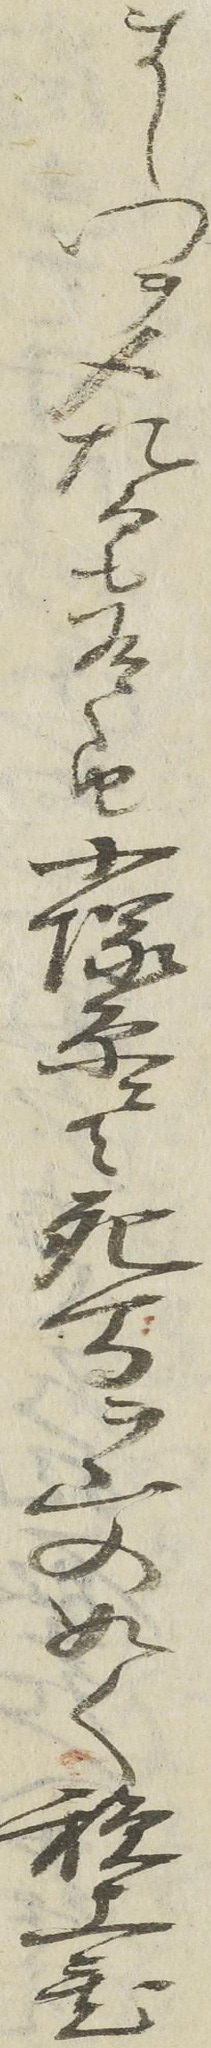まし門ヲ〆たるも有之由小塚原ニは死馬ヲ山の如く積上置
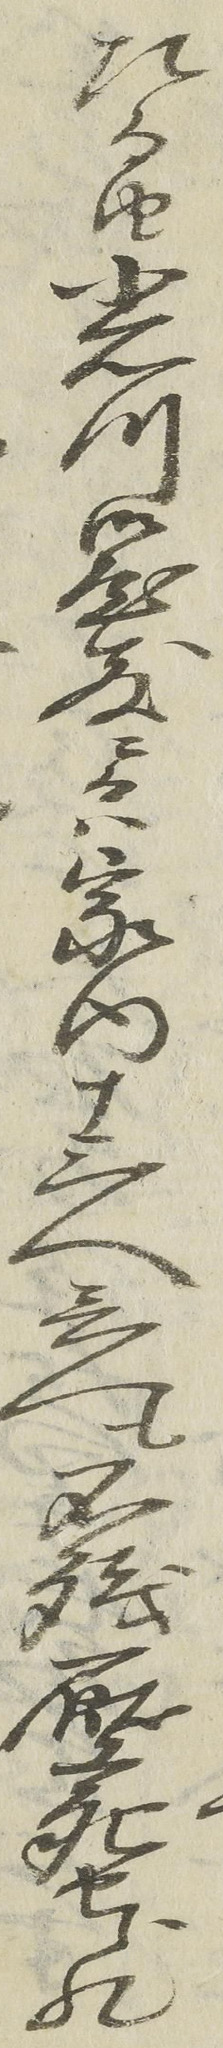たる由小石川屋敷ニ而ハ家内十三人壱人も不残圧死セられ
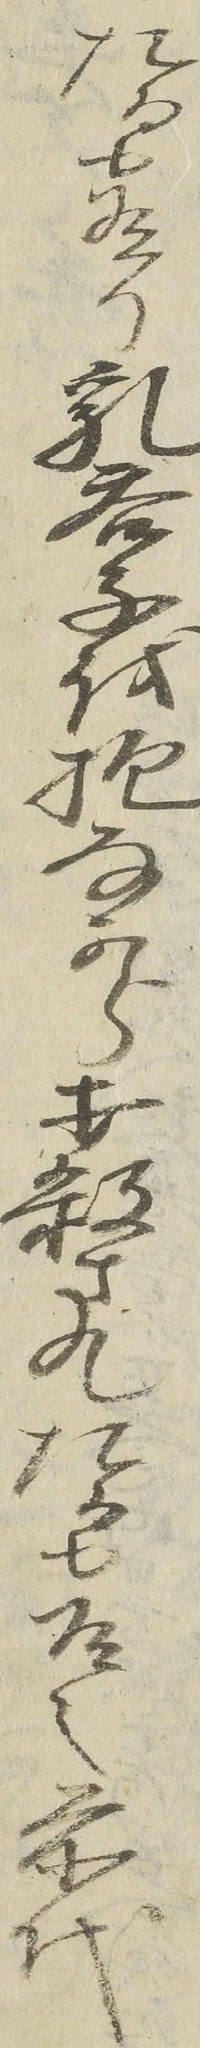たるも有り乳呑子を抱なから打殺されたるも有之前代

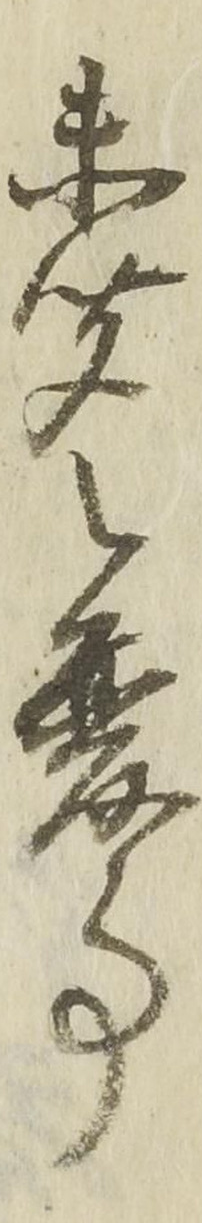未聞之変事
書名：安政乙卯江戸大地震筆記　安政丙辰八月大阪大雷雨之記追加　安政三辰年七月松前辺大地震并八月大風雨記録
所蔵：東京大学地震研究所図書室 Earthquake Research Institute Library, The University of Tokyo, JAPAN
